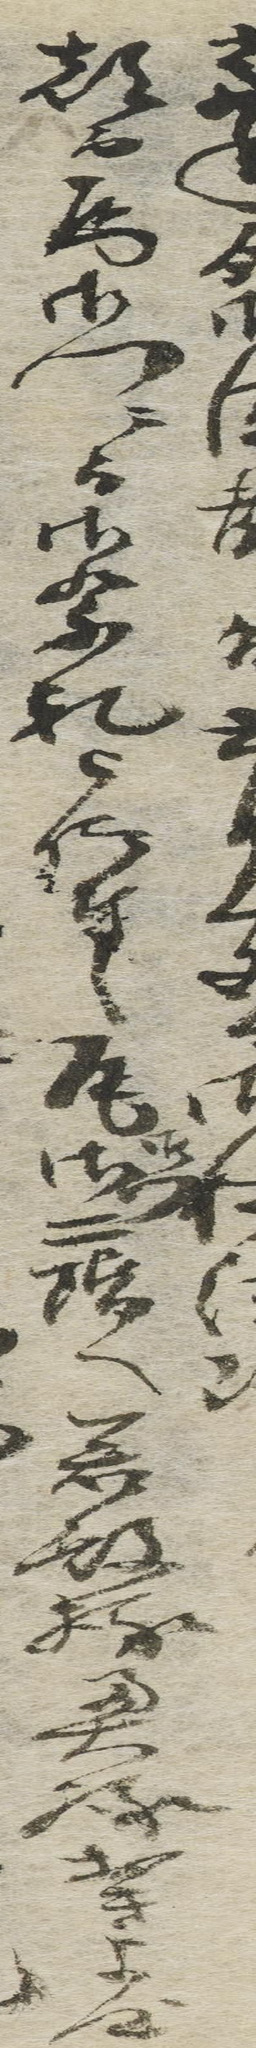都而瓦御門二而御祭礼被仰付候瓦御門御二階へ若殿様奥様おきよ殿
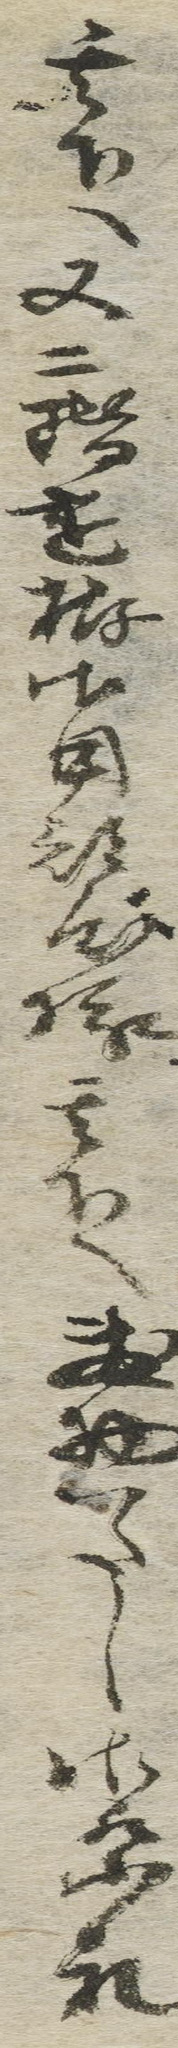其下へ又二階を拵御用部屋様其下へ敷物いたし御祭礼
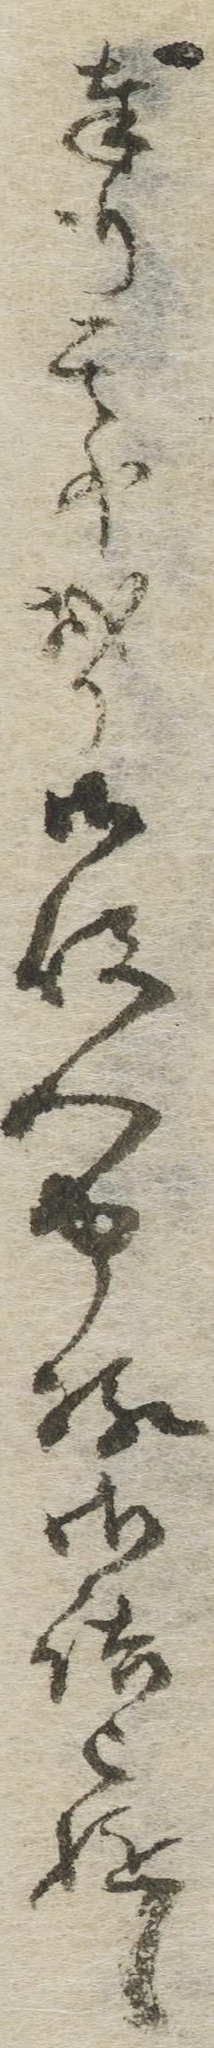奉行其外掛り御役人中様御詰被遊候

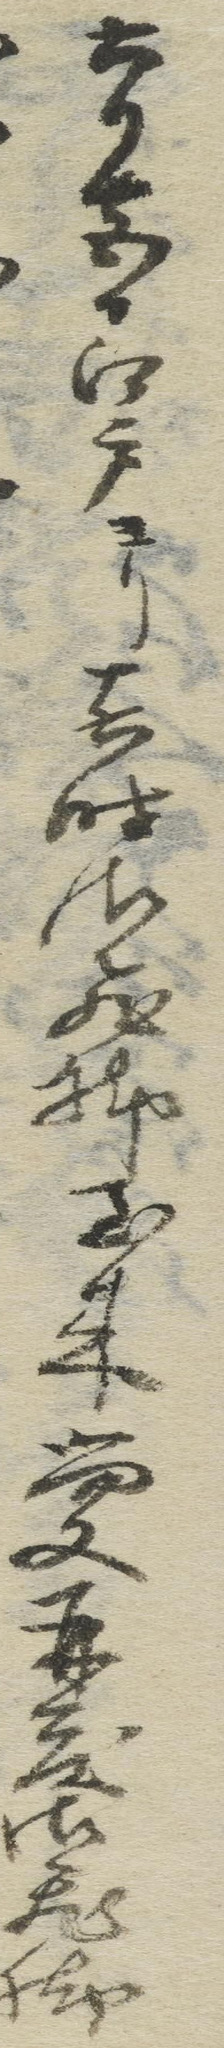六月十五日江戸ヨリ十六時御飛脚到来尚又再度御飛脚
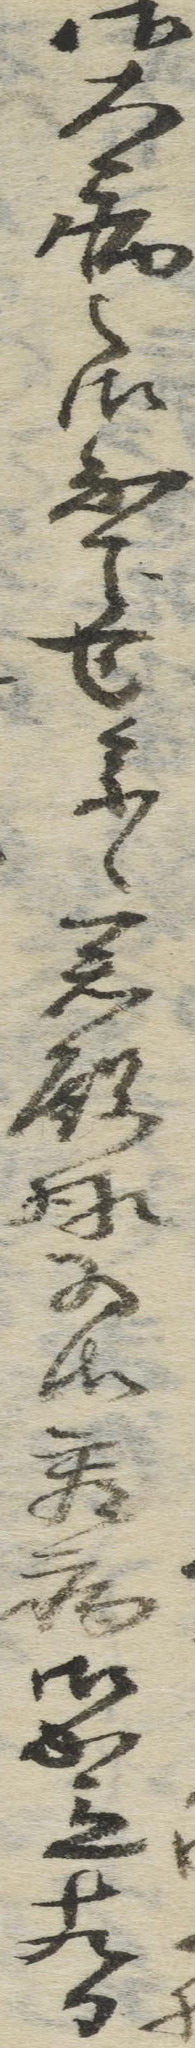御大病之御しらせ参候若殿様為御重病御出立十九日
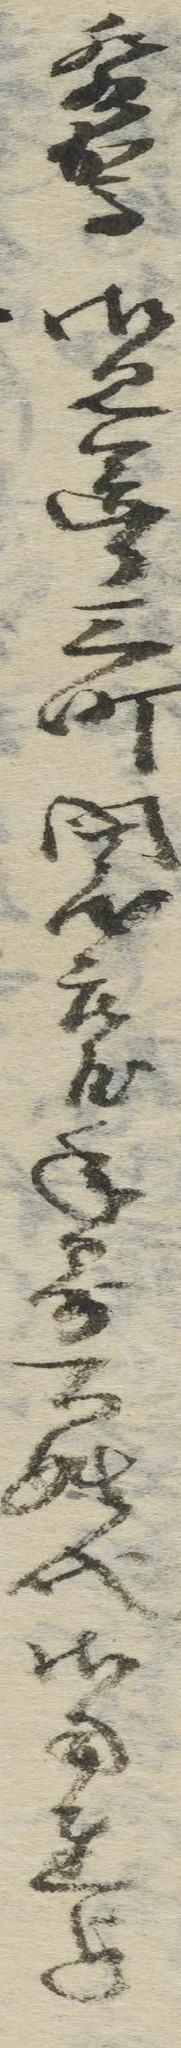発駕御見送り三町問屋庄屋年寄百姓代御用達迄
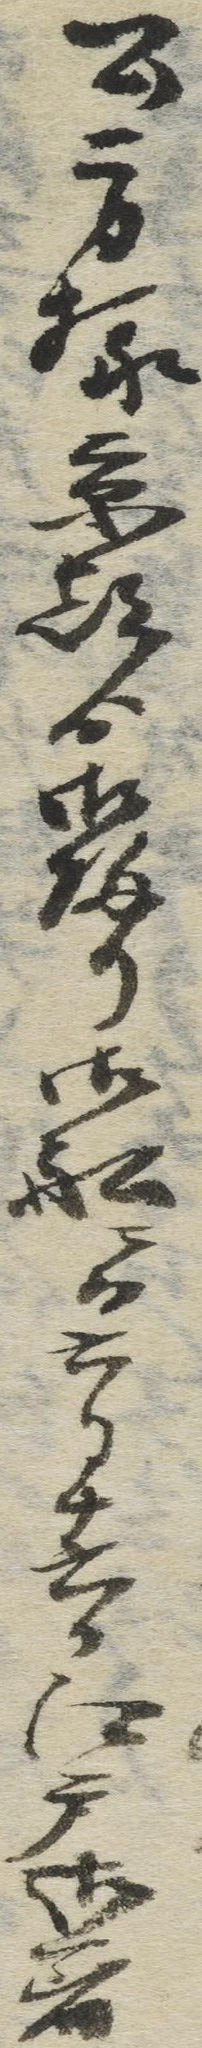公方様京都ゟ御帰り御船二而六月十六日江戸御着
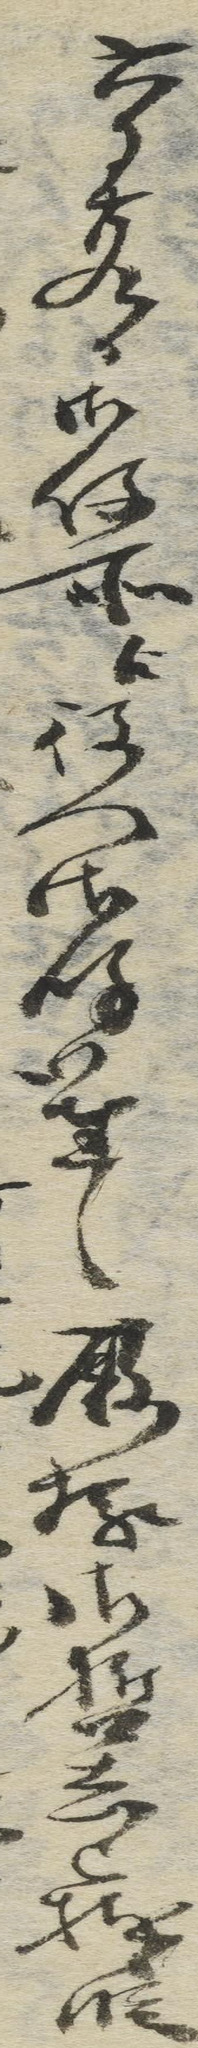六月廿九日御役所江御役人御呼御達し殿様御誓去被遊候段
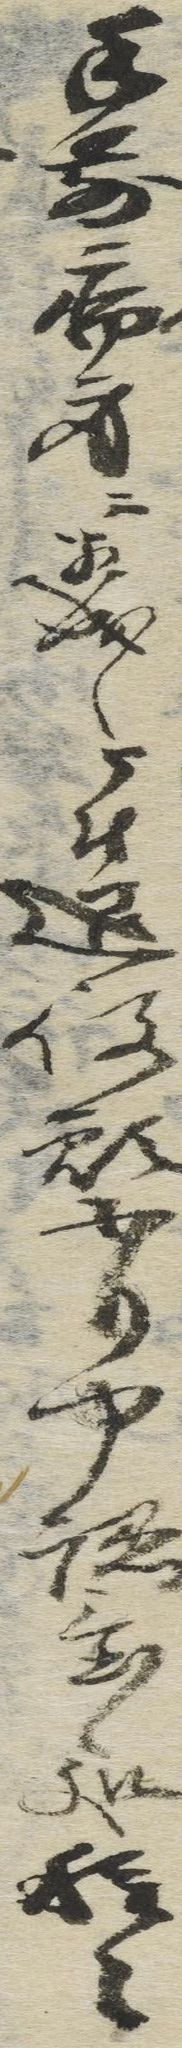手前病身二相成候二付退役願五月中認置候処種々
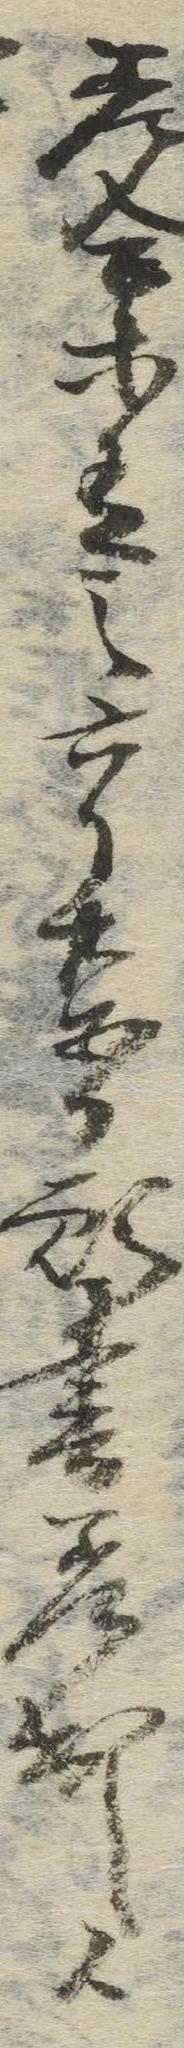差合等有之六月廿五日願書差出候
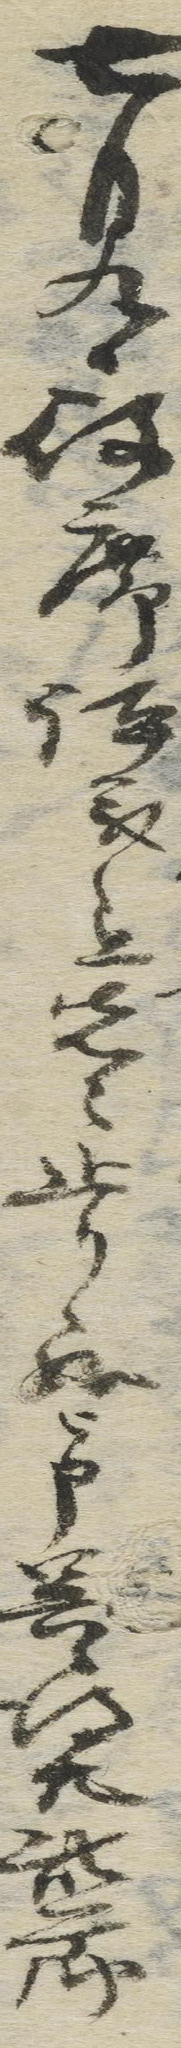七月九日役席評義之上先々止り候様被申呉候得共此節
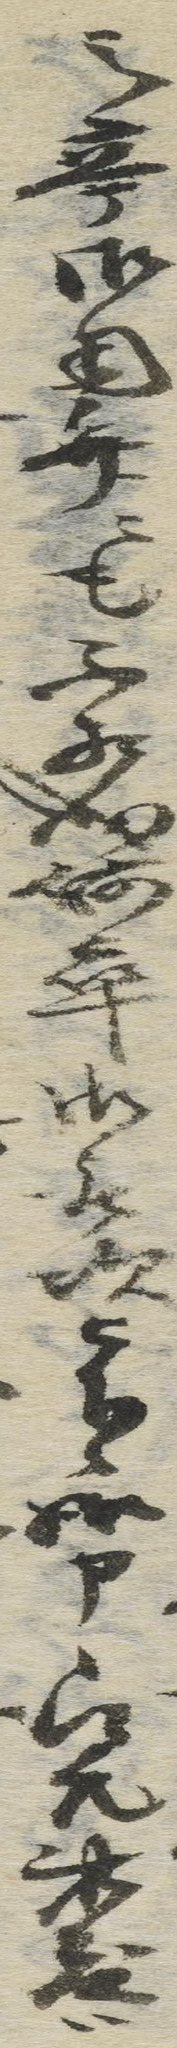之辛御用弁二も不相成何卒御取次被下候様申候得共此度ハ
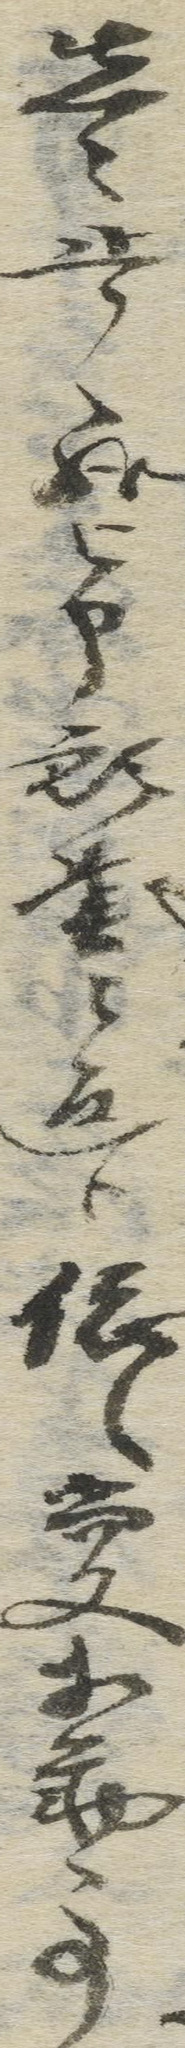先々止り候様被申願書被返候依之尚又相勤候事
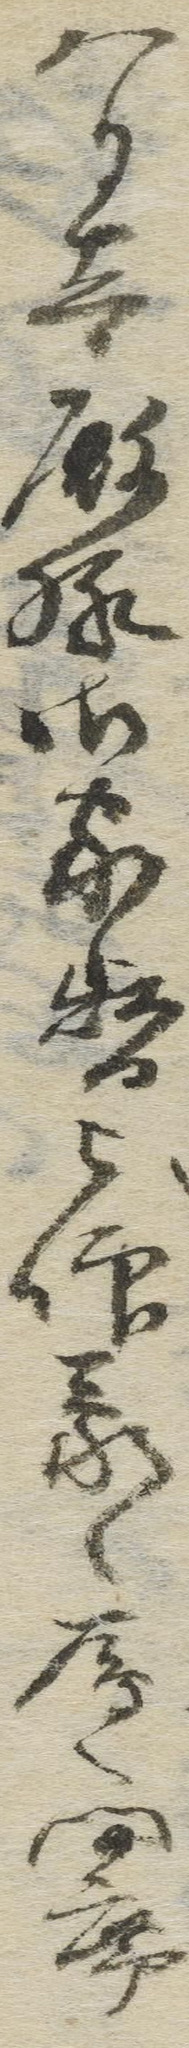八月十二日殿様御家督被仰蒙候忝く同席
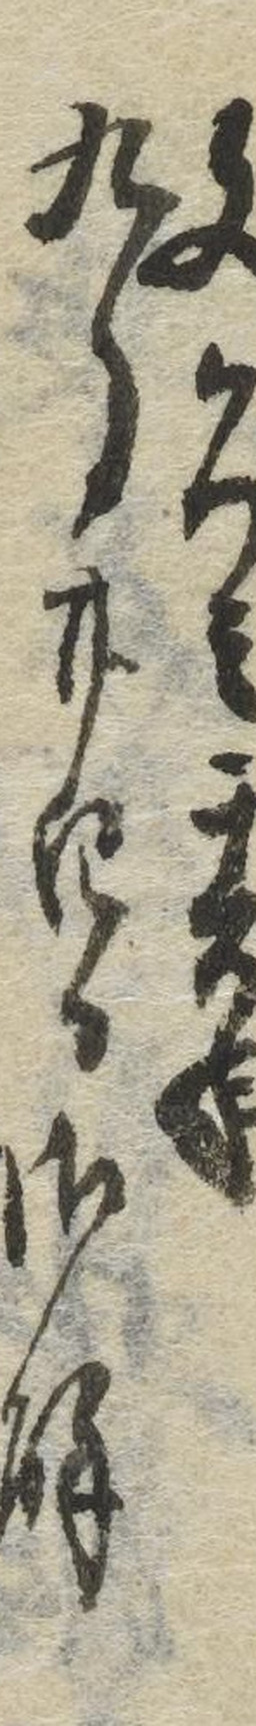九月廿四日御触
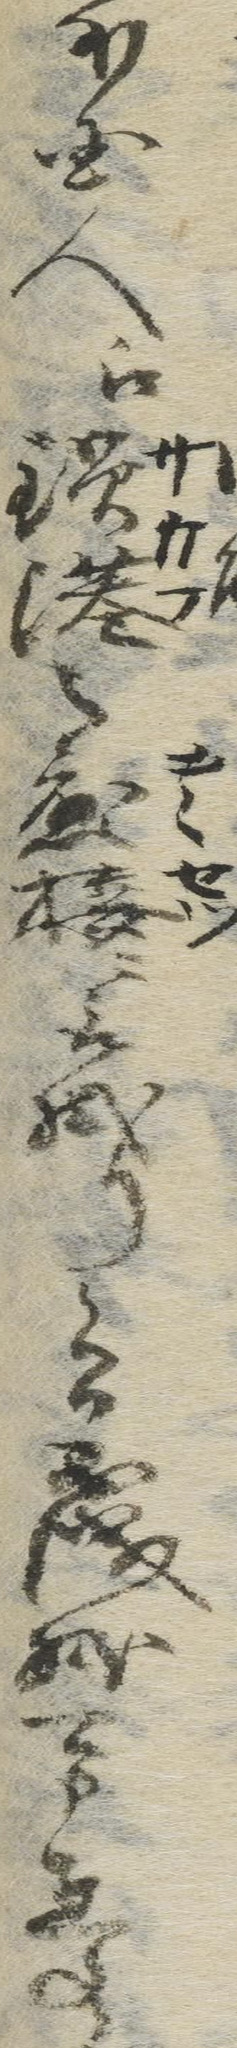外国人江鎖港之應楼二取掛り候間不洩様可申達事
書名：信濃越後　地震書留
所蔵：東京大学地震研究所図書室 Earthquake Research Institute Library, The University of Tokyo, JAPAN
